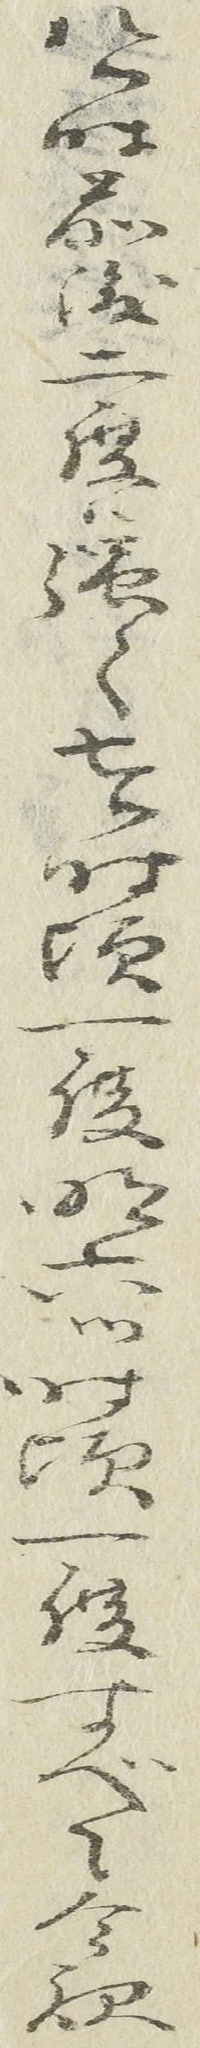八ツ時前後二度ハ強く七ツ時頃一度明六ツ時頃一度すべて今夜

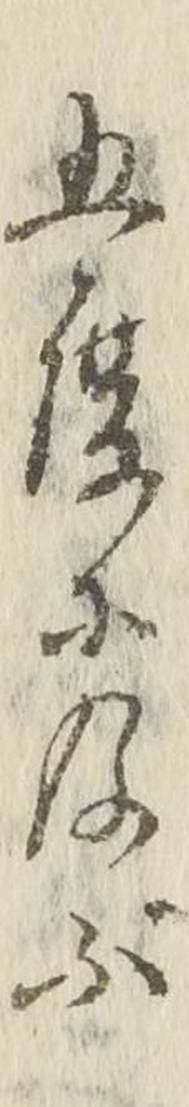五度に及ぶ
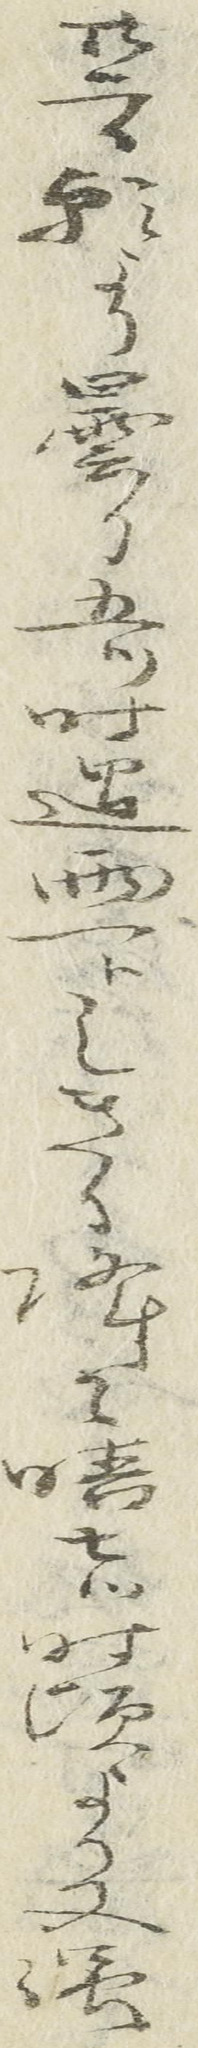廿二日朝より曇り五ツ時過雨一トしきり降て晴七ツ時頃より又強
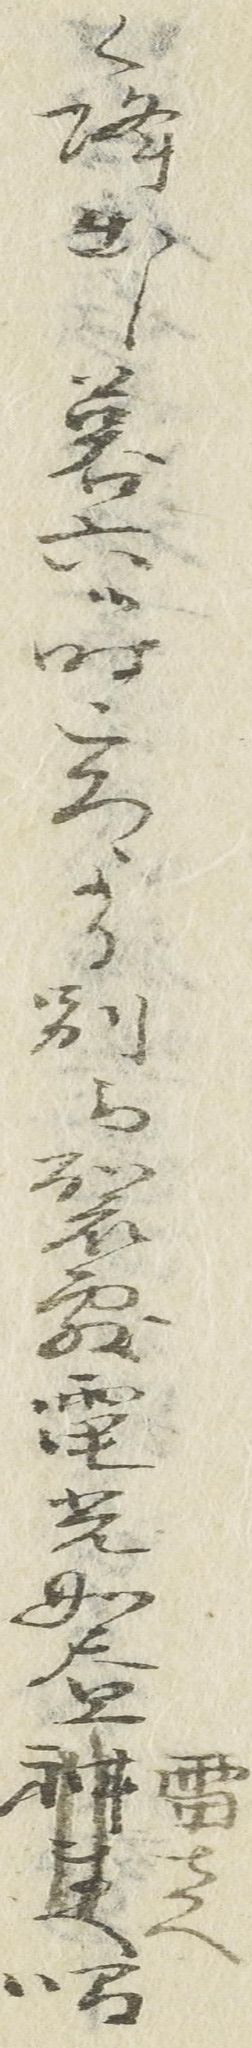く降出し暮六ツ時ころより別而裂敷電光如昼雷さへ鳴
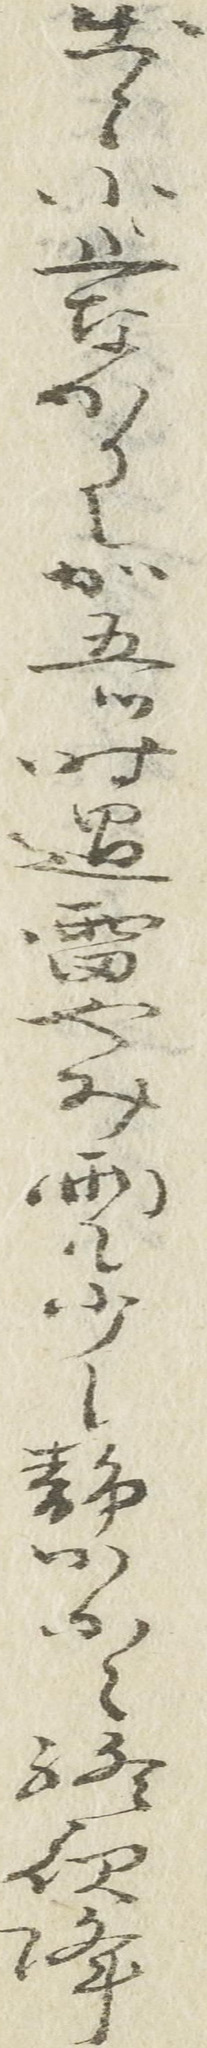出し小止なかりしが五ツ時過雷やみ雨も少し静かにて終夜降
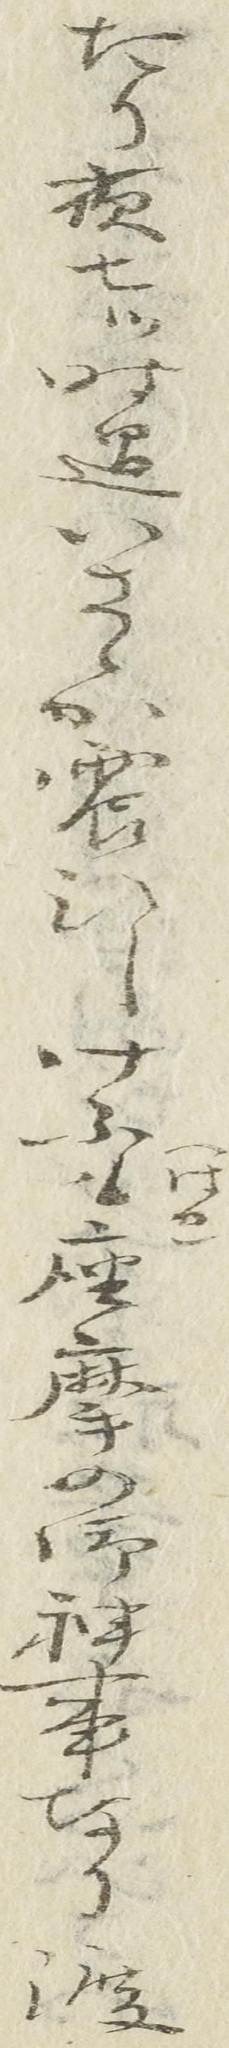たり夜七ツ時過いさゝか震ひしけふも座摩の御神事なり渡
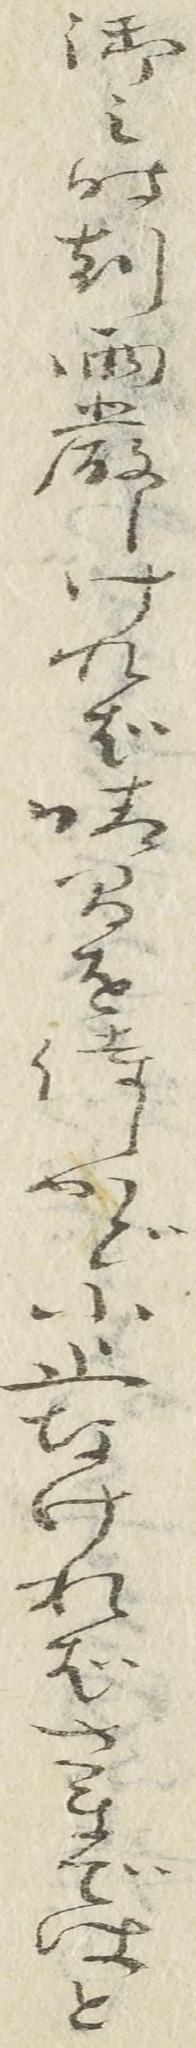御之時刻雨厳しければ晴間を待しかど小止なければさまではと
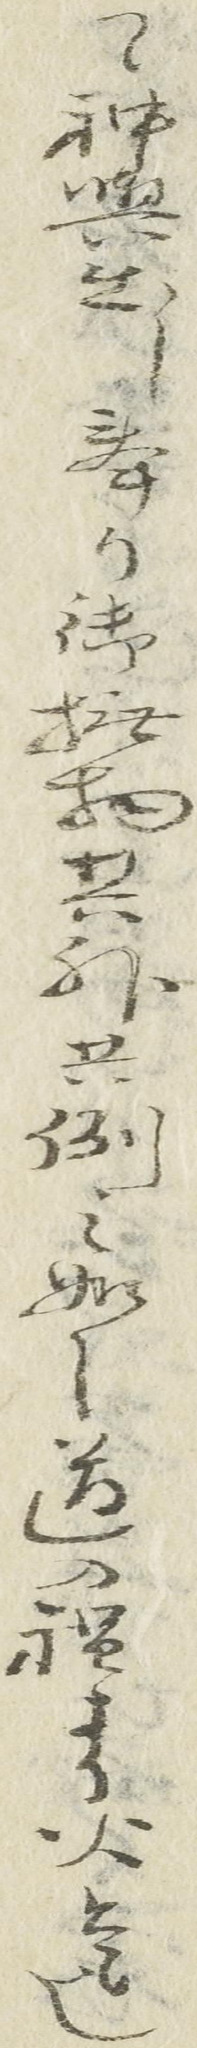て神輿出し奉り御撫物其外共例之如し道の程より火ともし
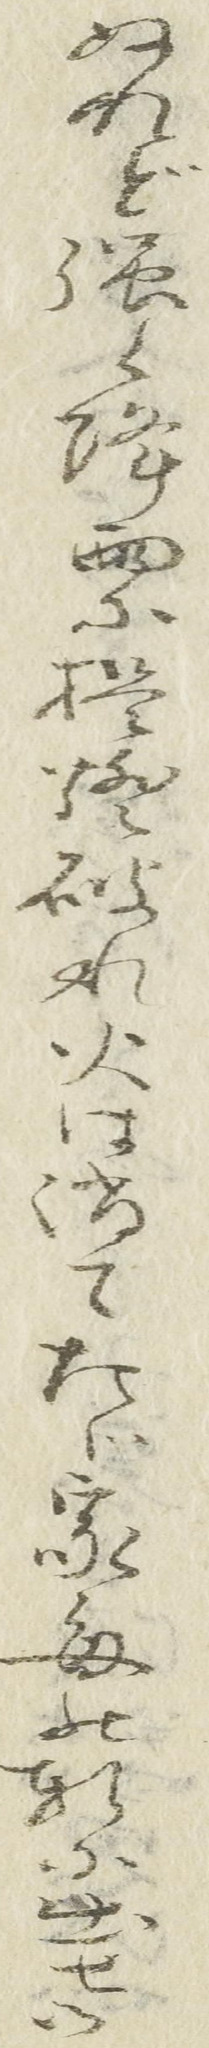ぬれど強く降雨に提燈破れ火は消てたゞ家毎の軒に出せる
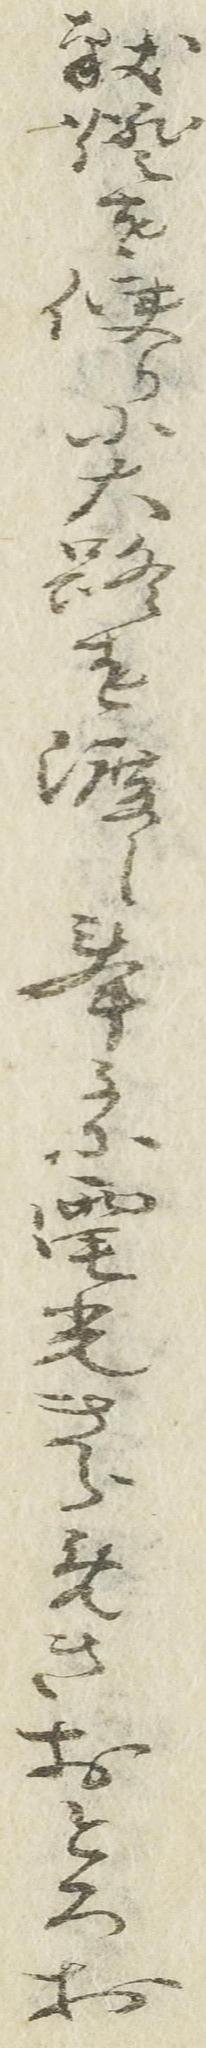献燈を便りに大路を渡し奉るに電光きらめきおとろお
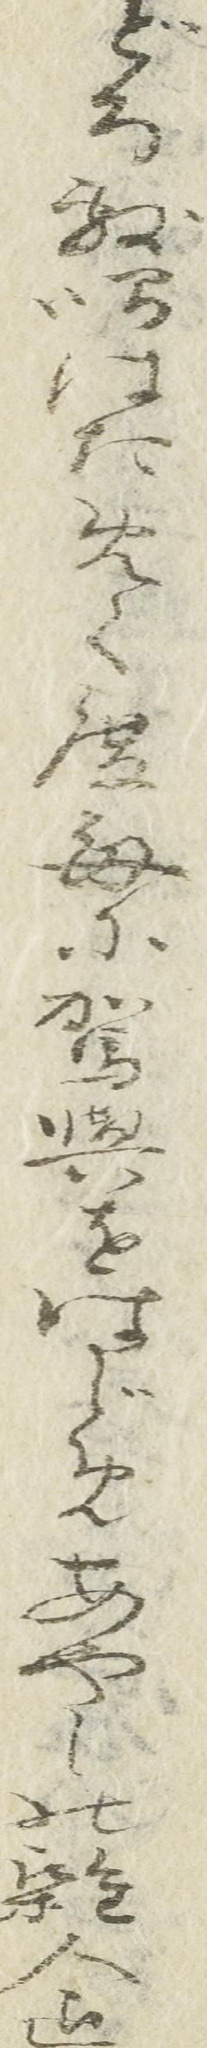どろ敷鳴はためく度毎に駕輿をはじめあやしの雑人迄
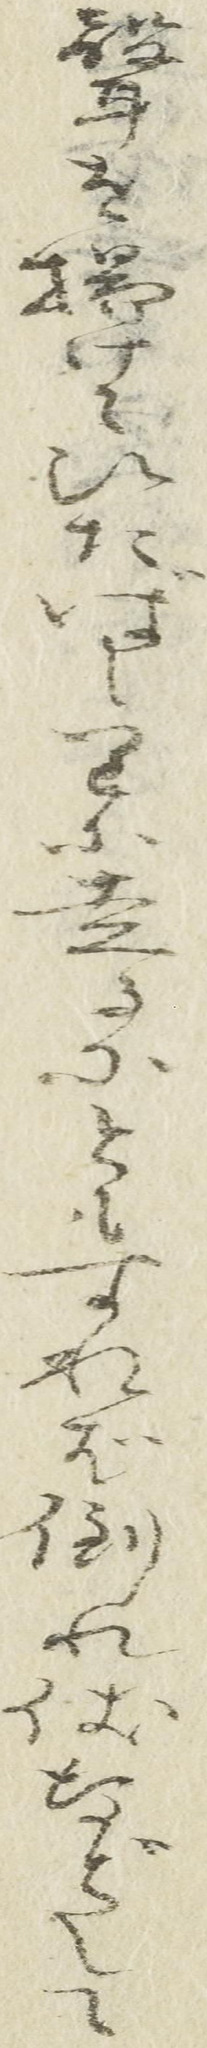声を揚けてひたばしりに走るにともすれば倒れ伏などして
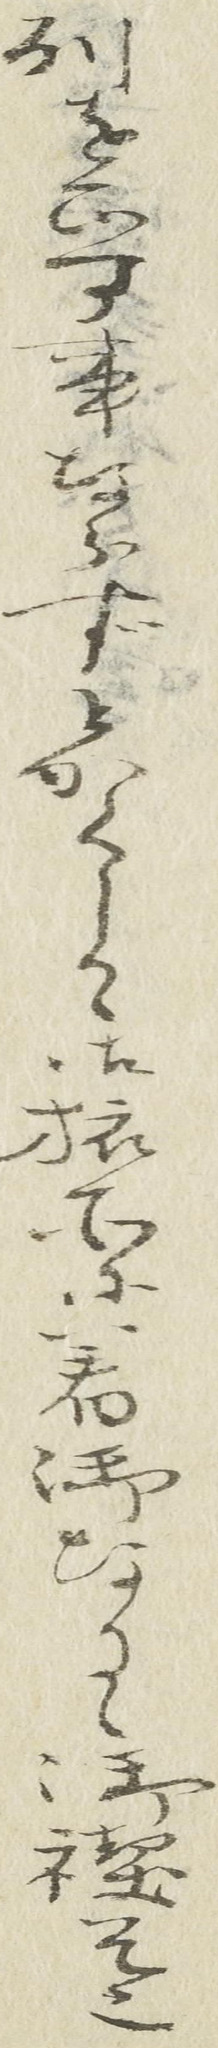列を正す事ならずとかくして御旅所に着御なりて御禊そこ
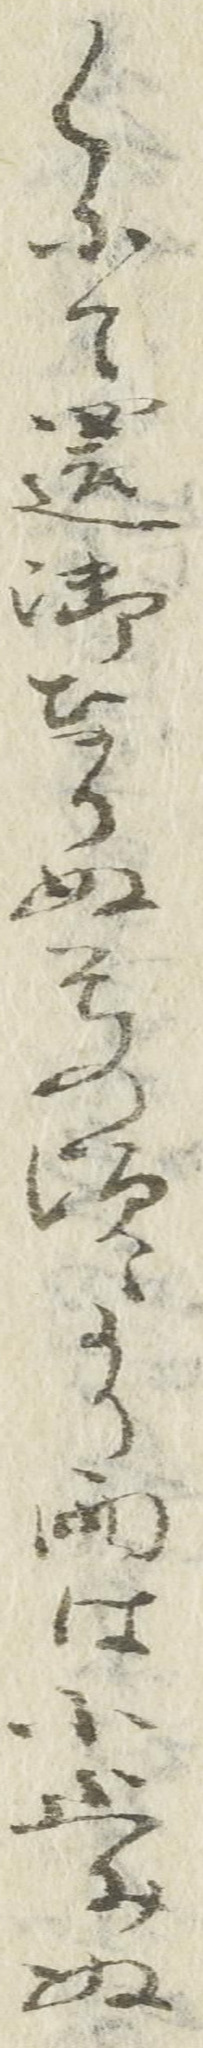〳〵にて還御なりぬその頃より雨は小止みぬ
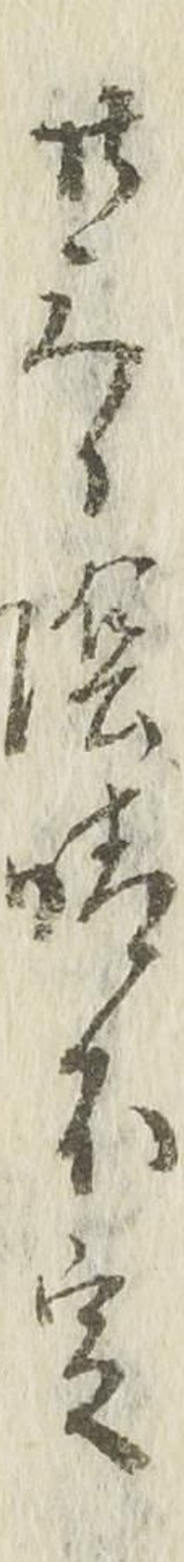廿三日陰晴不定
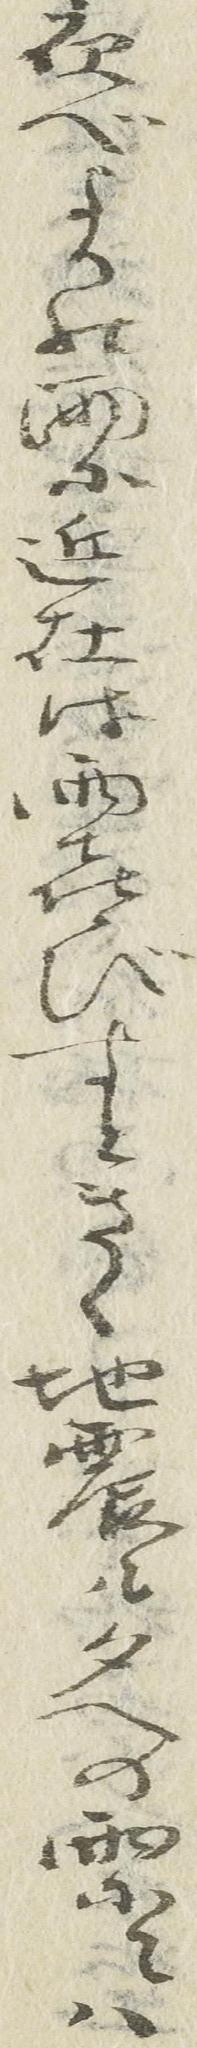夜べよりの雨に近在は雨喜びすときく自身も夕への雨にてハ
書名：地震前兆集　全
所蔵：東京大学地震研究所図書室 Earthquake Research Institute Library, The University of Tokyo, JAPAN
